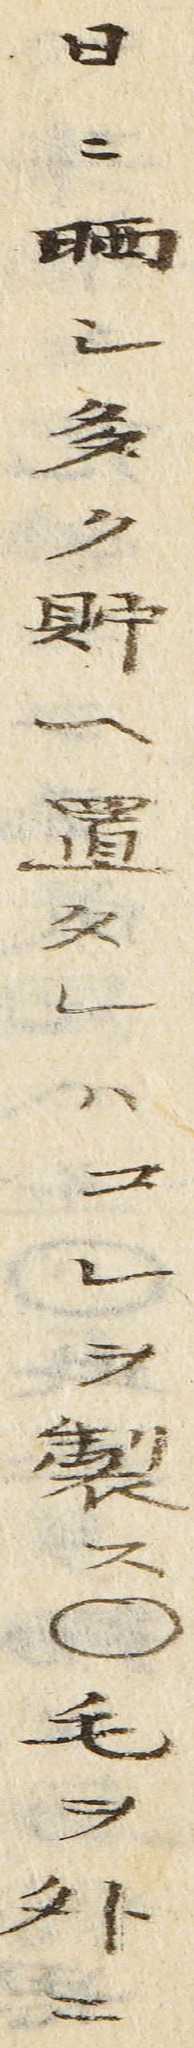日ニ晒シ多ク貯ヘ置タレハコレヲ製ス◯毛ヲ外ニ
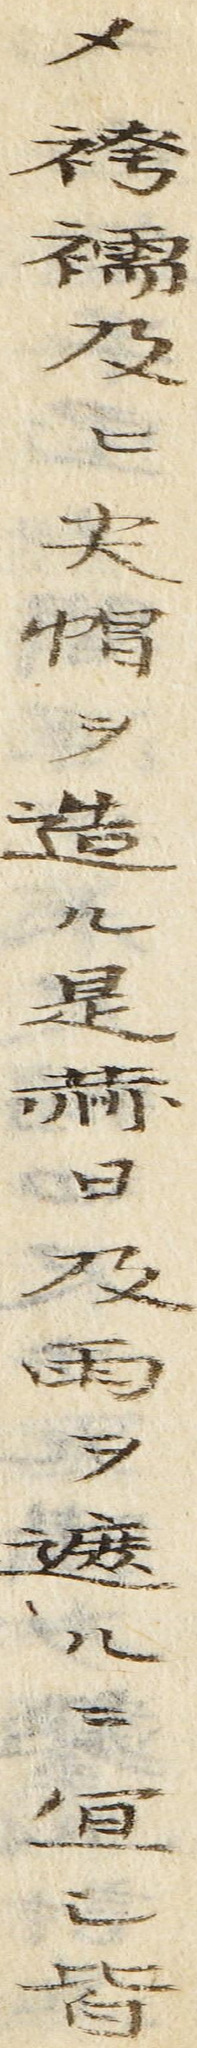シテ袴襦及ヒ尖帽ヲ造ル是赫日及雨ヲ遮ルニ宜シ皆
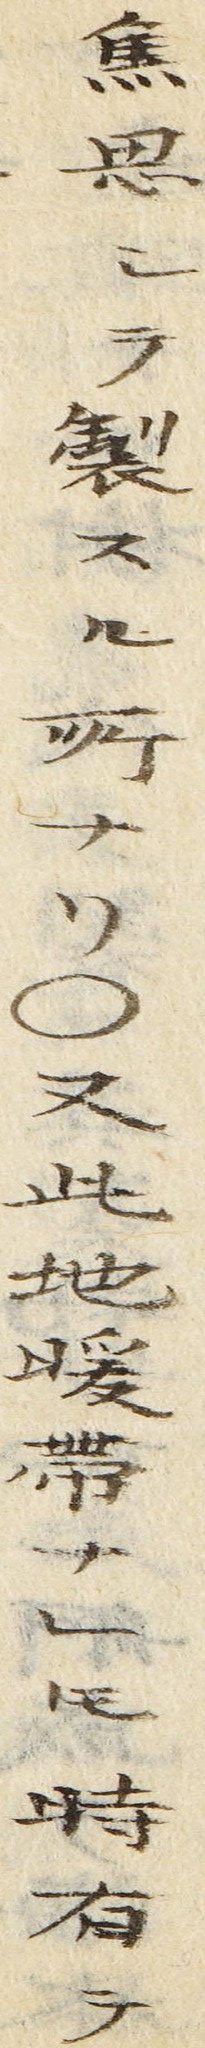焦思シテ製スル所ナリ◯又此地暖帯ナレトモ時有テ
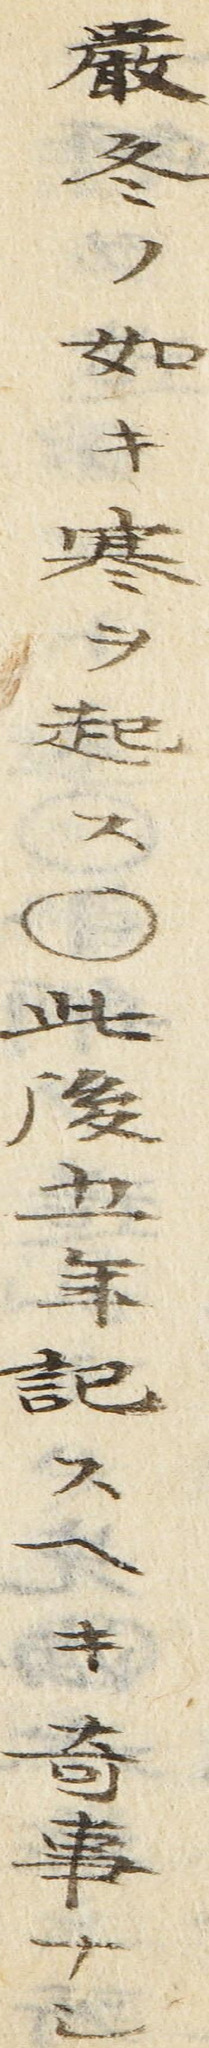厳冬ノ如キ寒ヲ起ス◯此後五年記スヘキ奇事ナシ
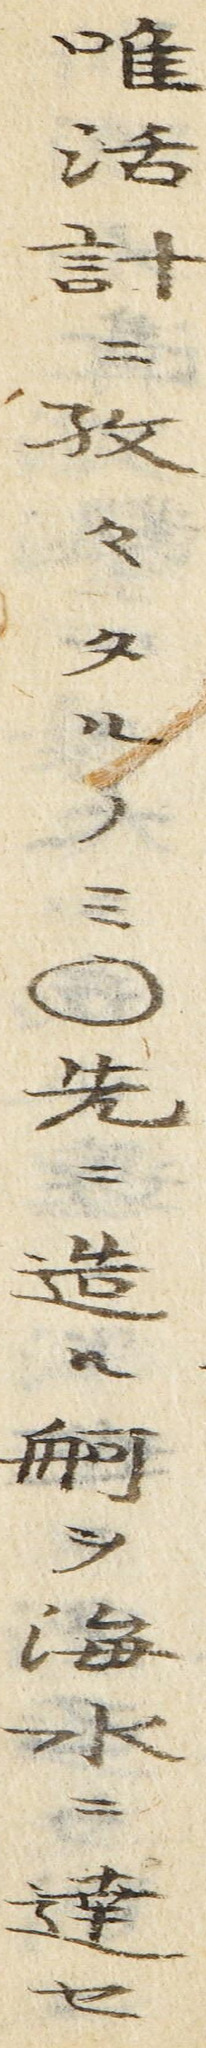唯活計ニ孜々タルノミ◯先ニ造ル舸ヲ海水ニ達セ

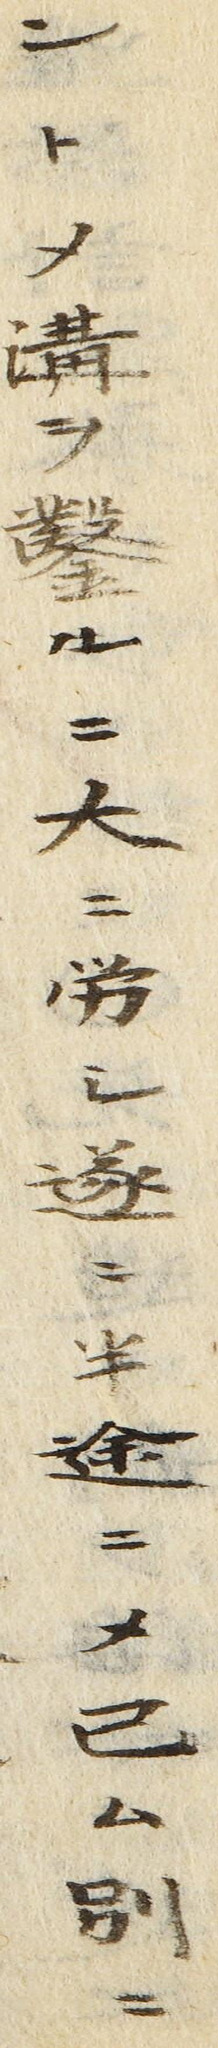ントシテ溝ヲ鑿ルニ大ニ労シ遂ニ半途ニシテ已ム別ニ
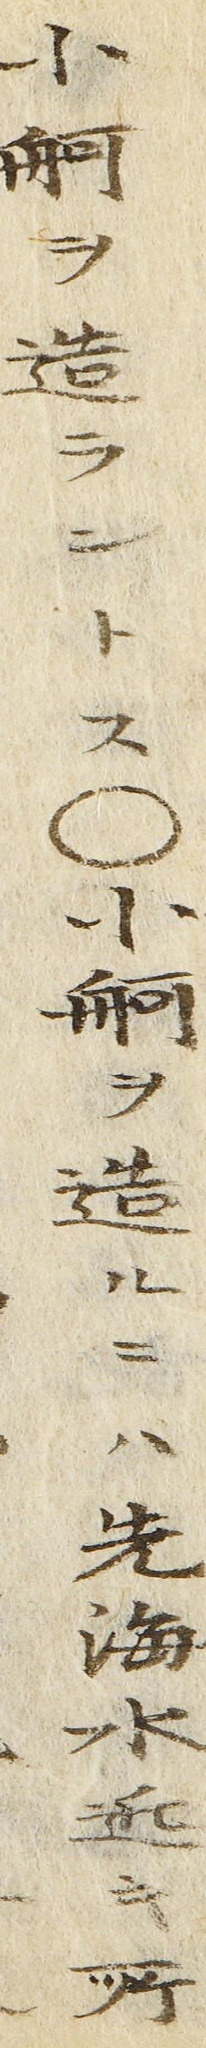小舸ヲ造ラントス◯小舸ヲ造ルニハ先海水近キ所
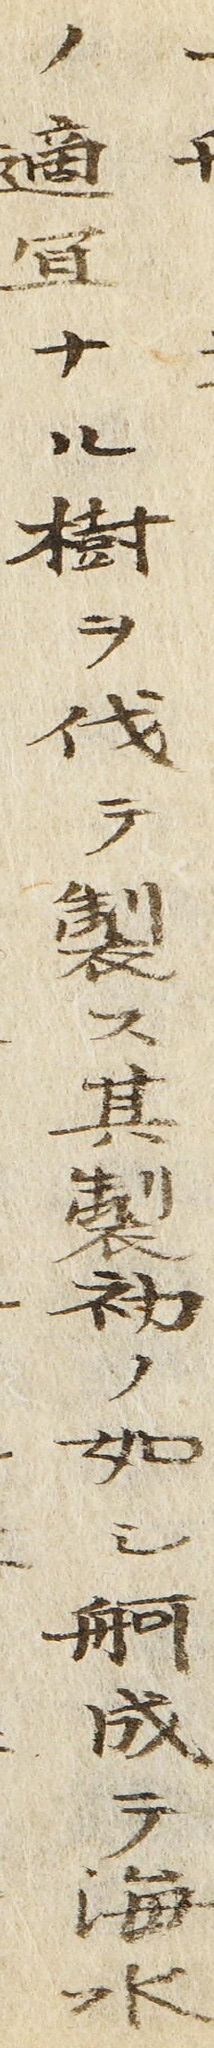ノ適宜ナル樹ヲ伐テ製ス其製初ノ如シ舸成テ海水
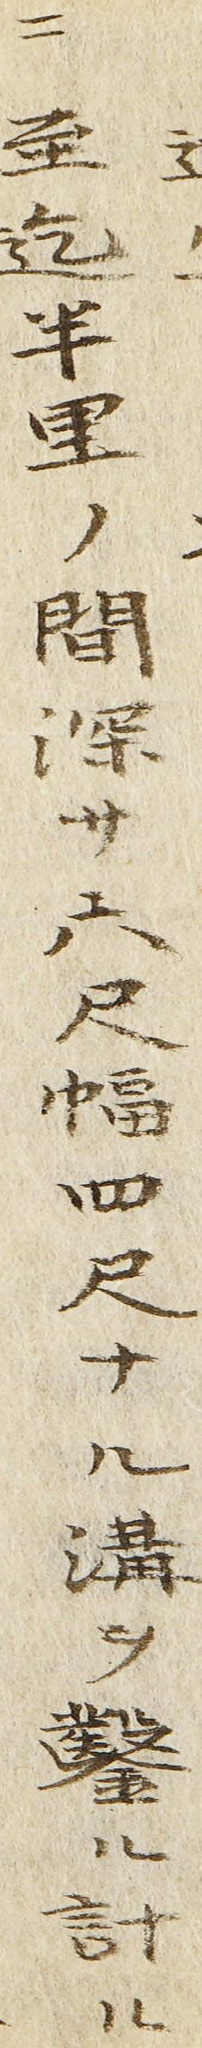ニ至迄半里ノ間深サ六尺幅四尺ナル溝ヲ鑿ル計ル
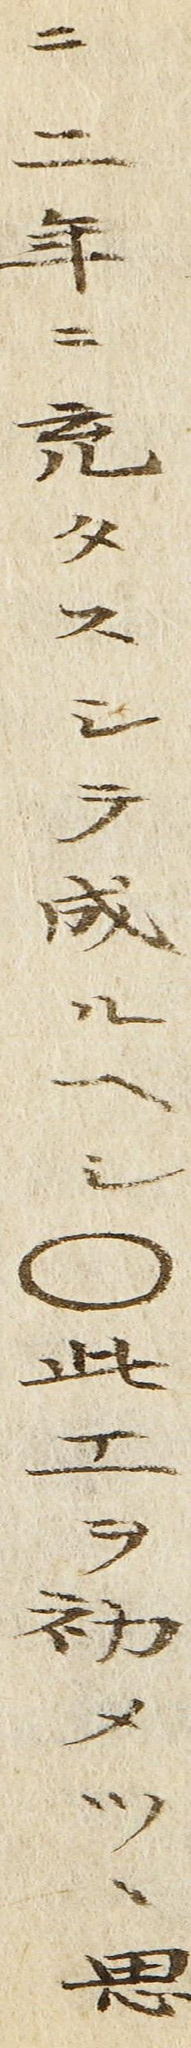ニ二年ニ充タスシテ成ルヘシ◯此工ヲ初メツヽ思
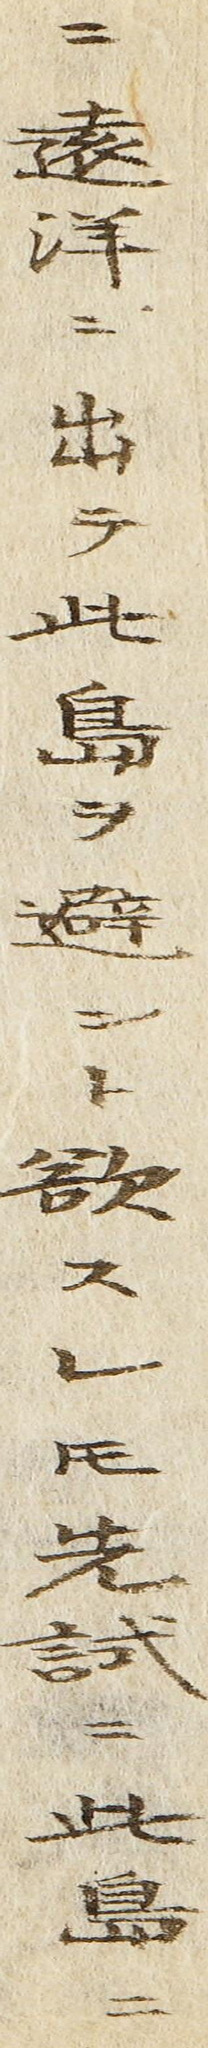ニ遠洋ニ出テ此島ヲ避ント欲スレトモ先試ニ此島ニ
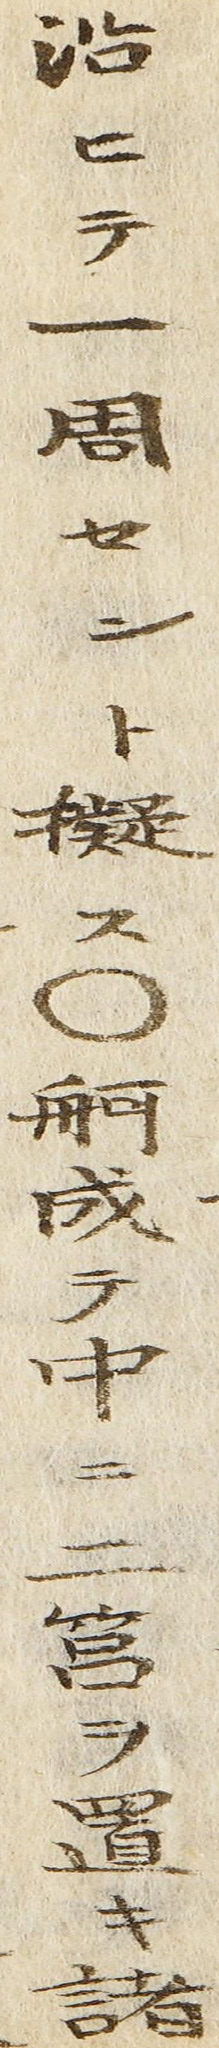沿ヒテ一周セント擬ス◯舸成テ中ニ二筥ヲ置キ諸
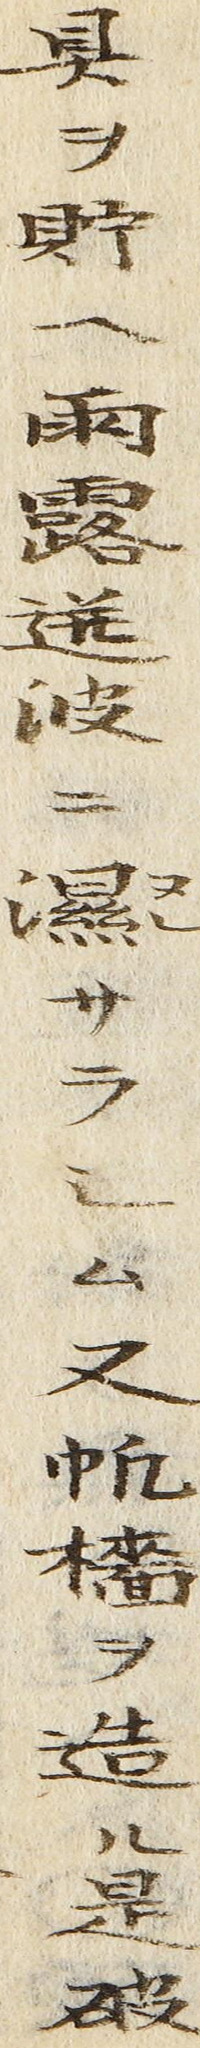具ヲ貯ヘ雨露迸波ニ湿サラシム又帆檣ヲ造ル是破
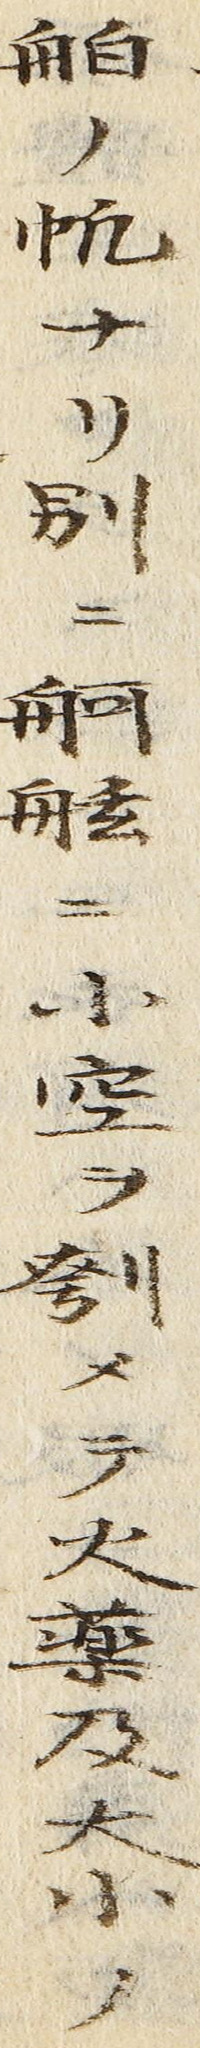舶ノ帆ナリ別ニ舸舷ニ小空ヲ刳メテ火薬及大小ノ
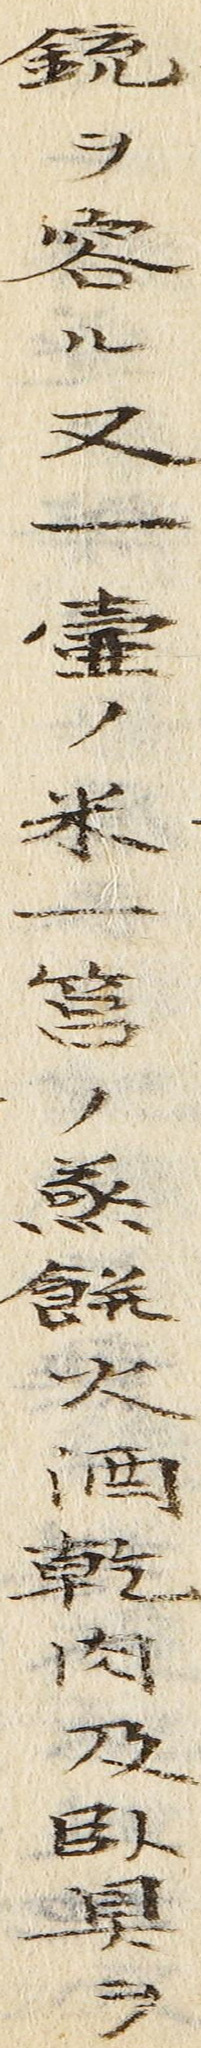銃ヲ容ル又一壺ノ水一筥ノ蒸餅火酒乾肉及臥具ヲ
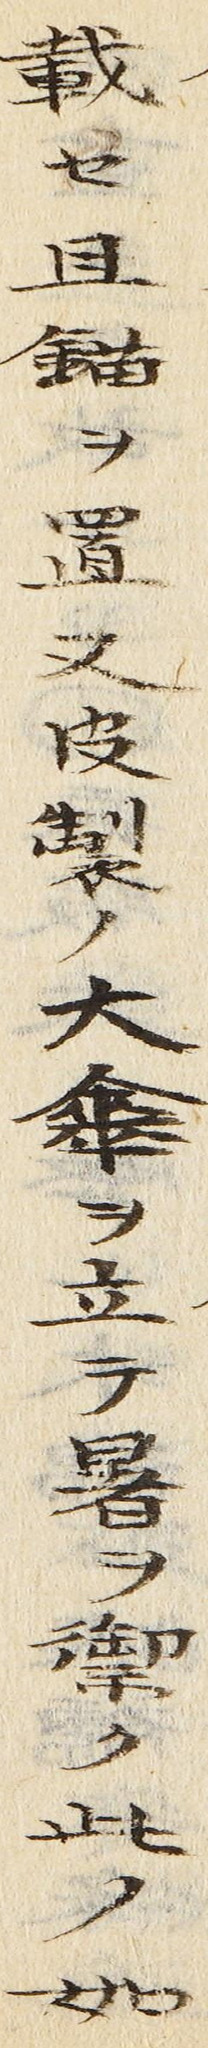載セ且錨ヲ置又皮製ノ大傘ヲ立テ暑ヲ禦ク此ノ如
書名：漂流紀事
